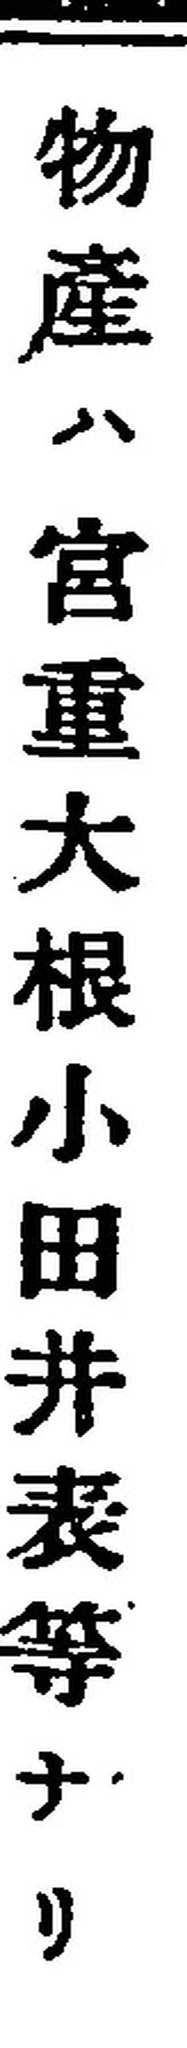物產物產ハ宮重大根小田井表等ナリ
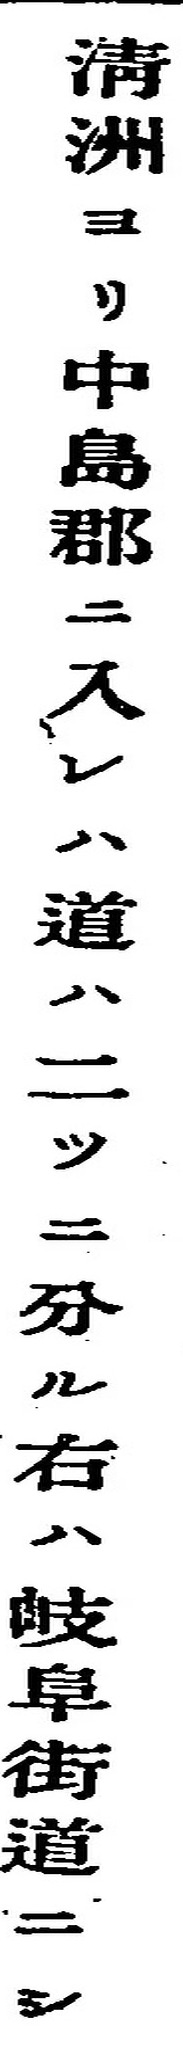淸洲ヨリ中島郡ニ入レハ道ハ二ツニ分ル右ハ岐阜街道ニシ
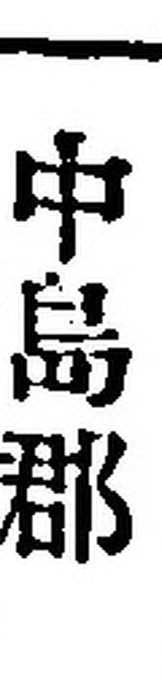中島郡
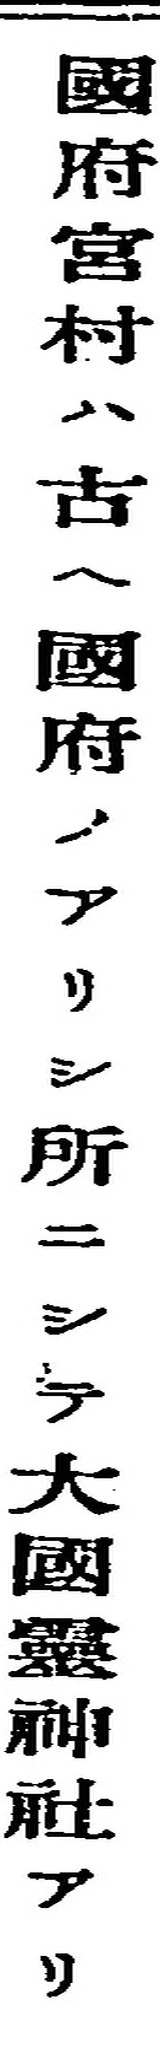國府宮村國府宮村ハ古ヘ國府ノアリシ所ニシテ大國靈神社アリ
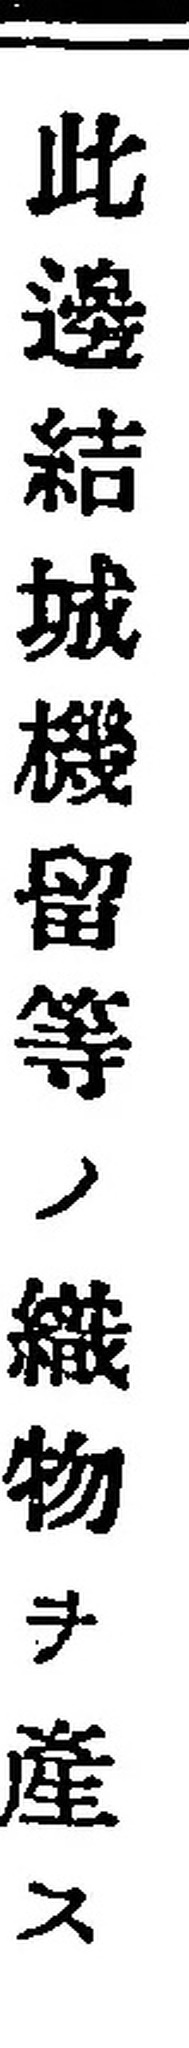物產此邊結城機留等ノ織物ヲ產ス
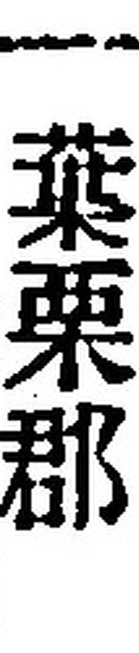葉栗郡
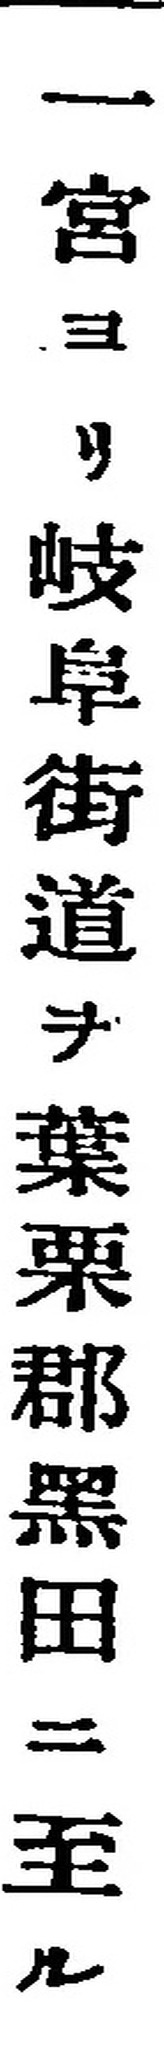一宮ヨリ岐阜街道ヲ葉栗郡黑田ニ至ル
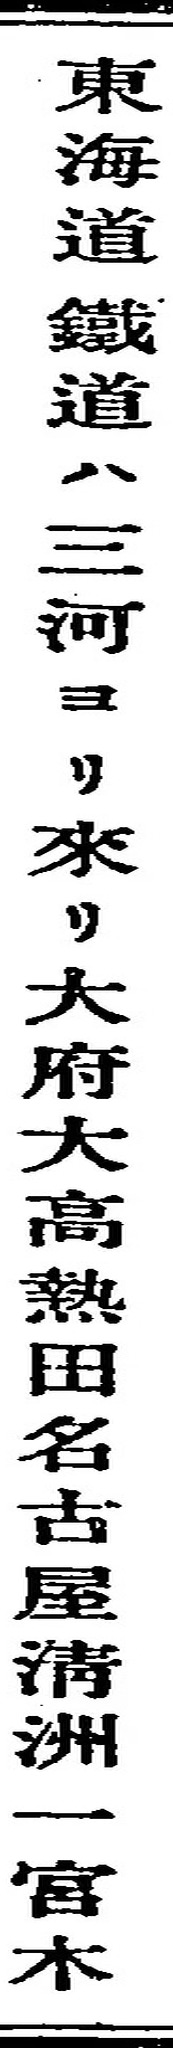東海道東海道鐵道ハ三河ヨリ來リ大府大高熱田名古屋淸洲一宮木
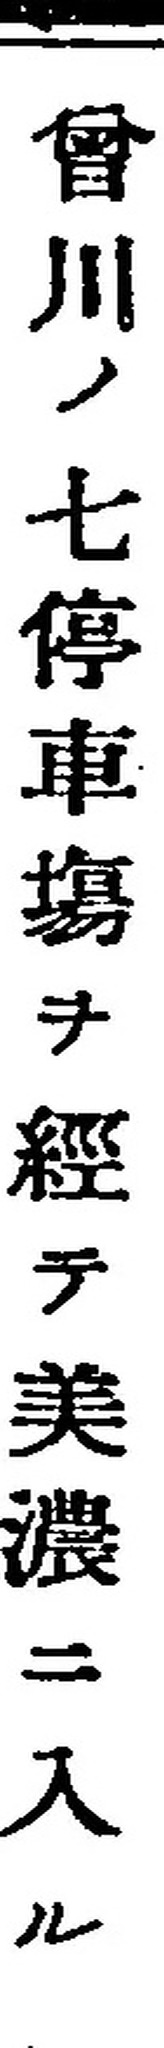鐵道曾川ノ七停車場ヲ經テ美濃ニ入ル
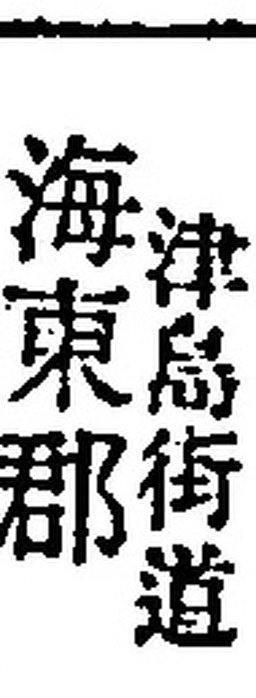海東郡
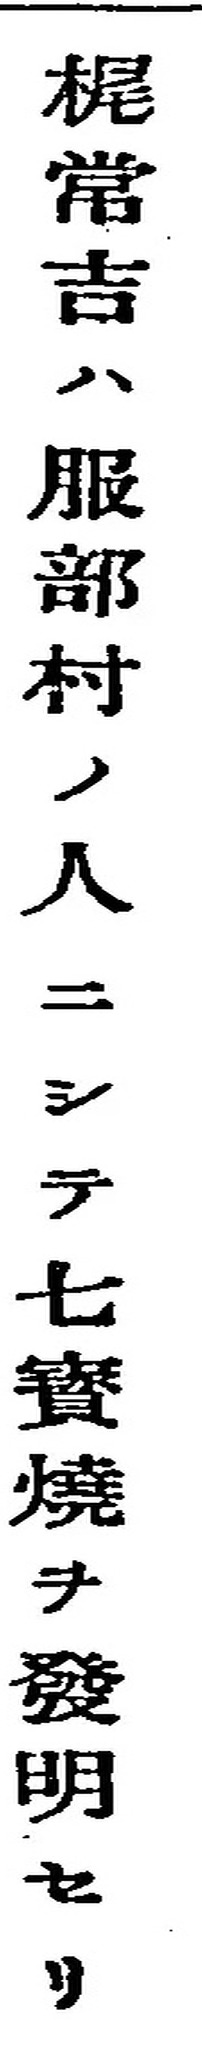梶常吉梶常吉ハ服部村ノ人ニシテ七寶燒ヲ發明セリ
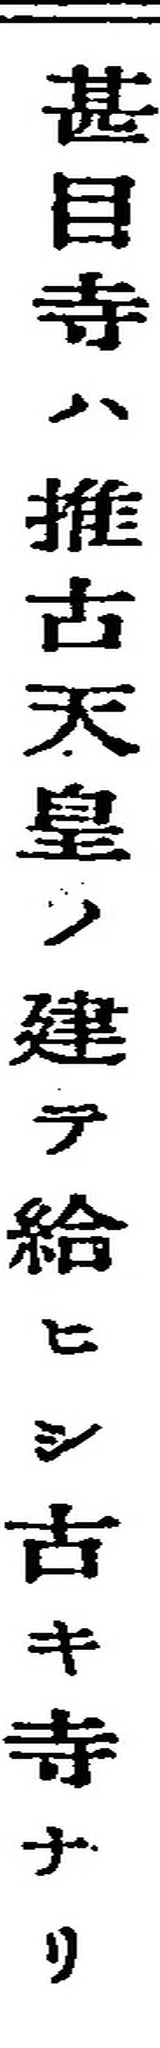甚目寺甚目寺ハ推古天皇ノ建テ給ヒシ古キ寺ナリ

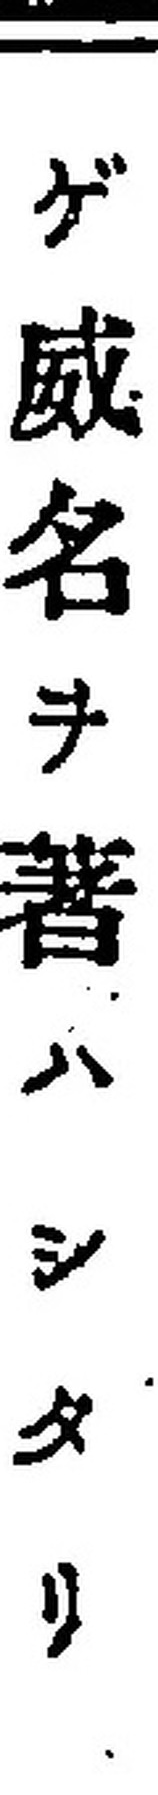ゲ威名ヲ著ハシタリ
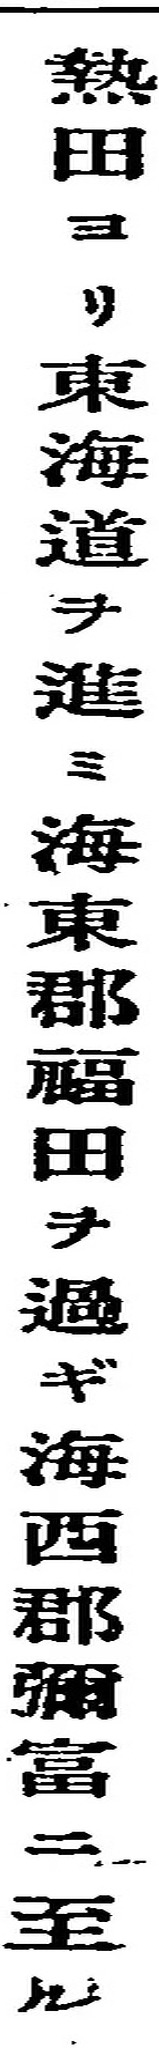海西郡熱田ヨリ東海道ヲ進ミ海東郡福田ヲ過ギ海西郡彌富ニ至ル
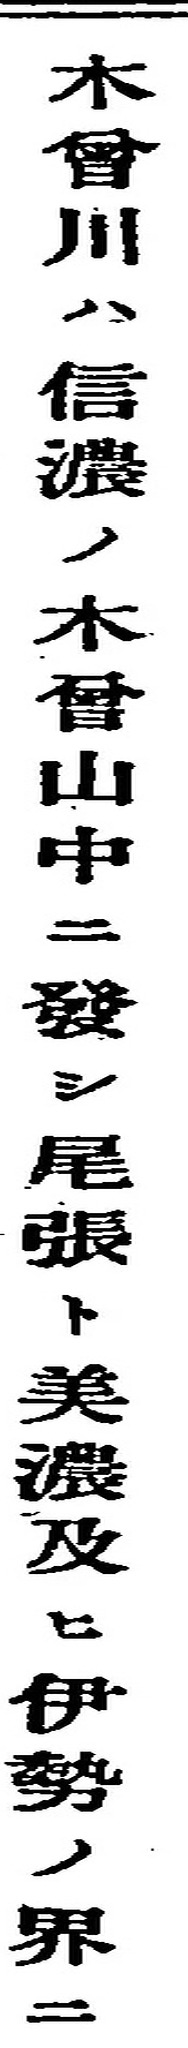木曾川木曾川ハ信濃ノ木曾山中ニ發シ尾張ト美濃及ヒ伊勢ノ界ニ
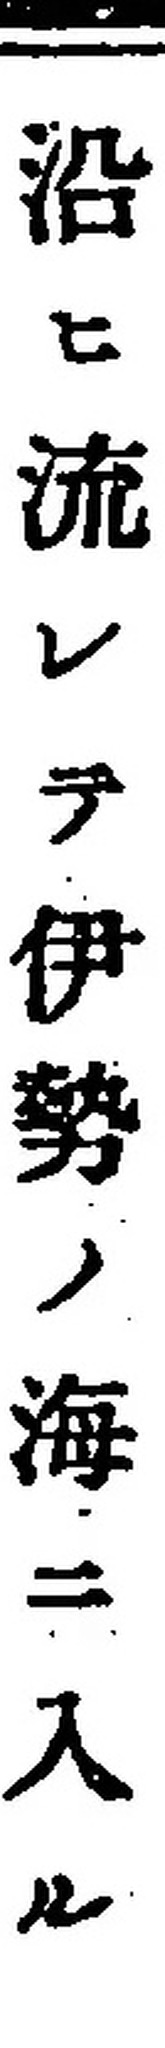沿ヒ流レテ伊勢ノ海ニ入ル
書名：郷土誌
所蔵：国立国会図書館 National Diet Library, JAPAN
